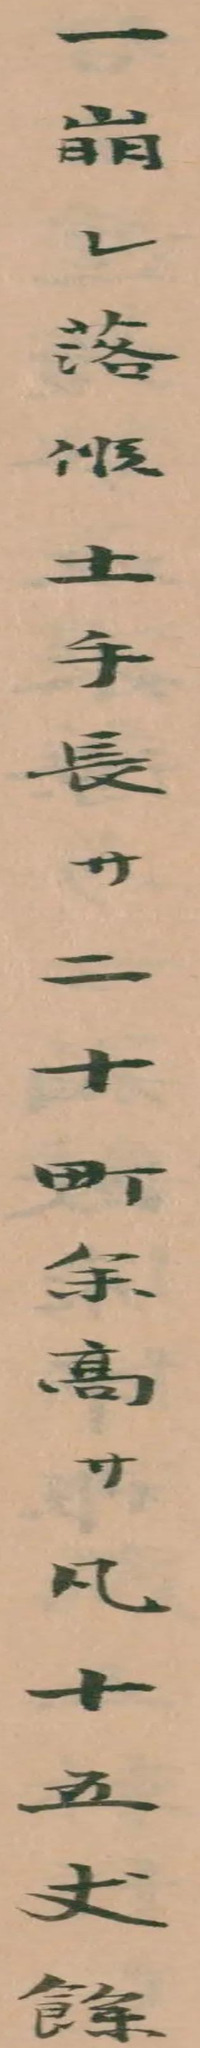一崩レ落候土手長サ二十町余高サ凡十五丈余
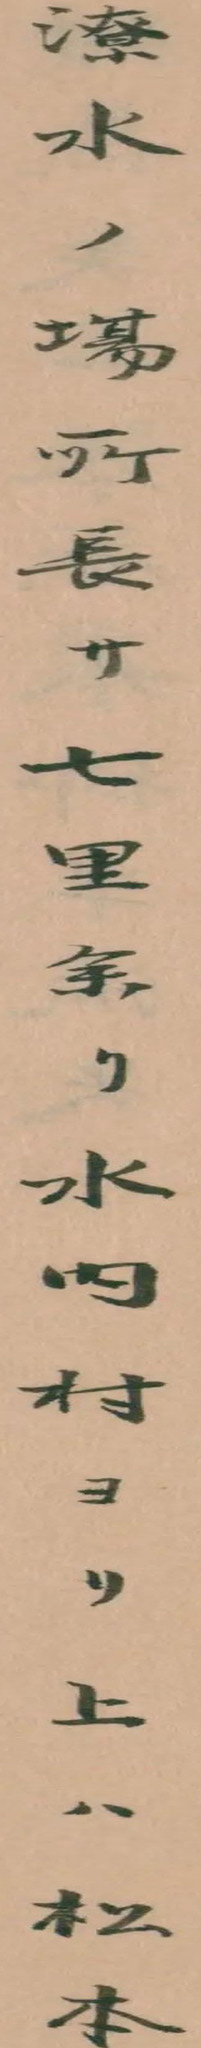潦水ノ場所長サ七里余リ水内村ヨリ上ハ松本
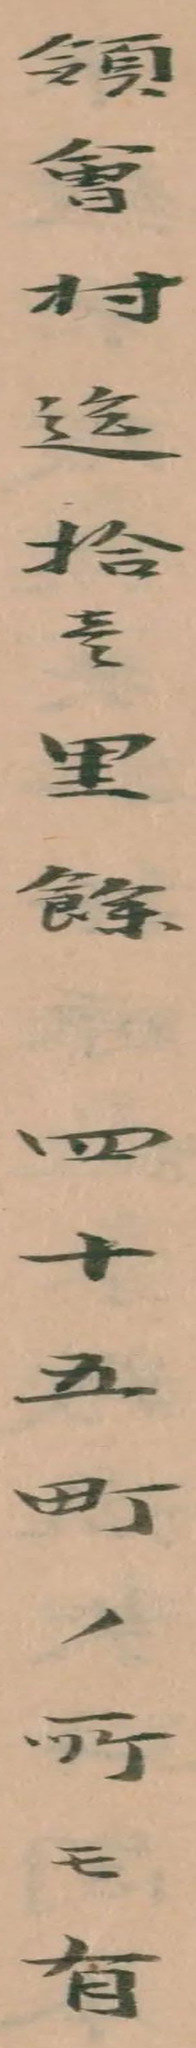領会村迄拾壱里余四十五町ノ所モ有
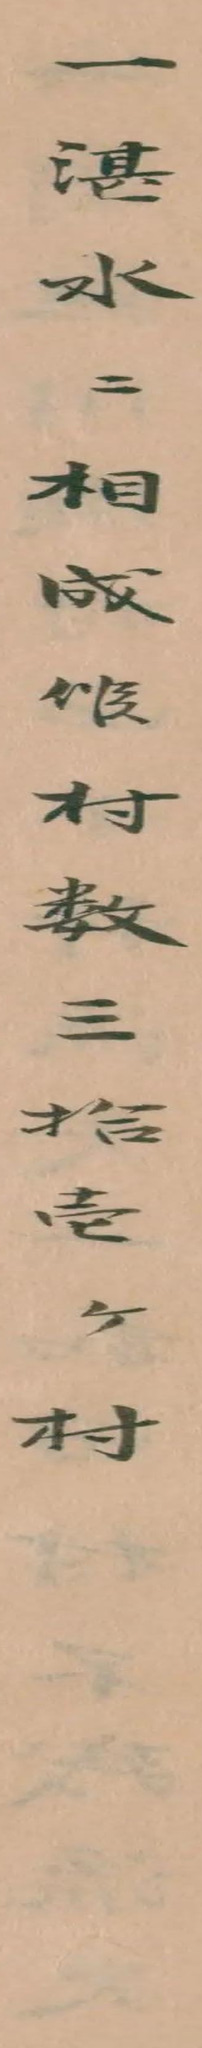一湛水ニ相成候村数三拾壱ケ村
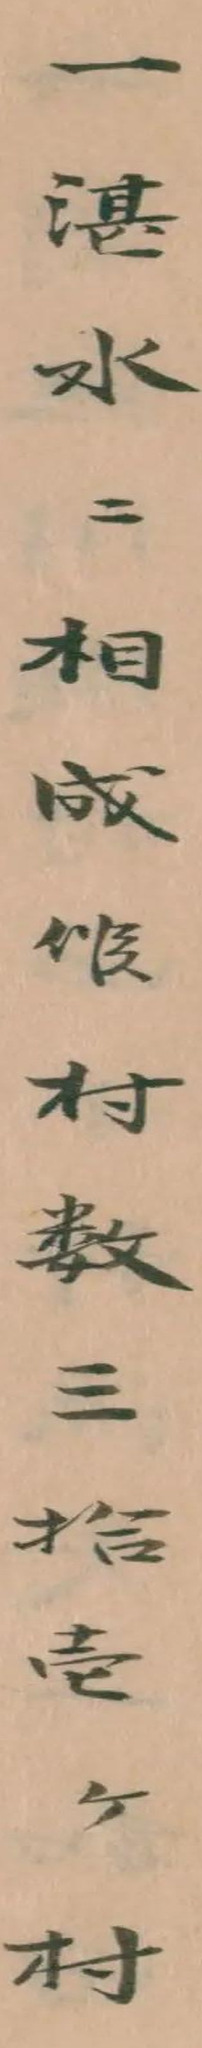一湛水ニ相成候村数三拾壱ケ村
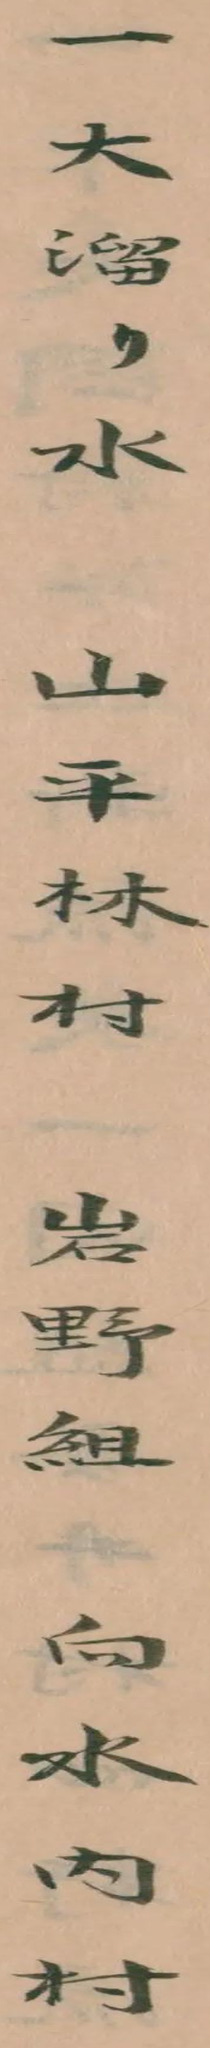一大溜リ水山平林村岩野組向水内村
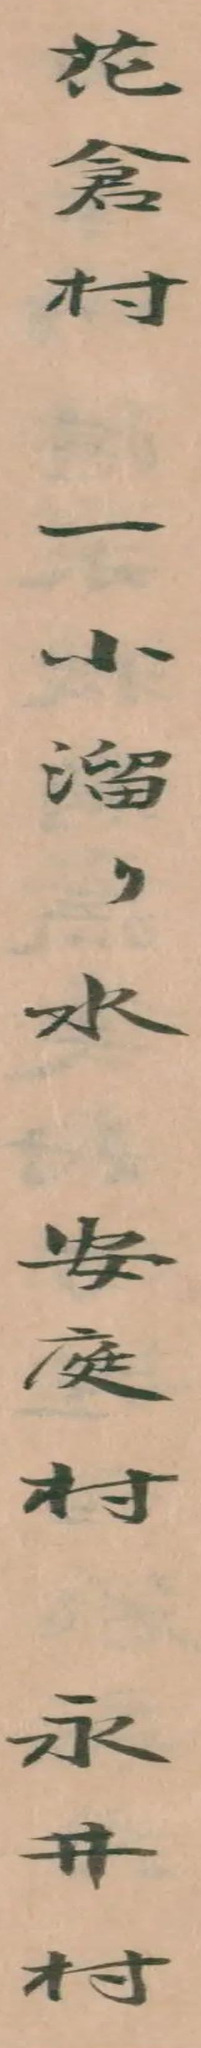花倉村一小溜リ水安庭村永井村
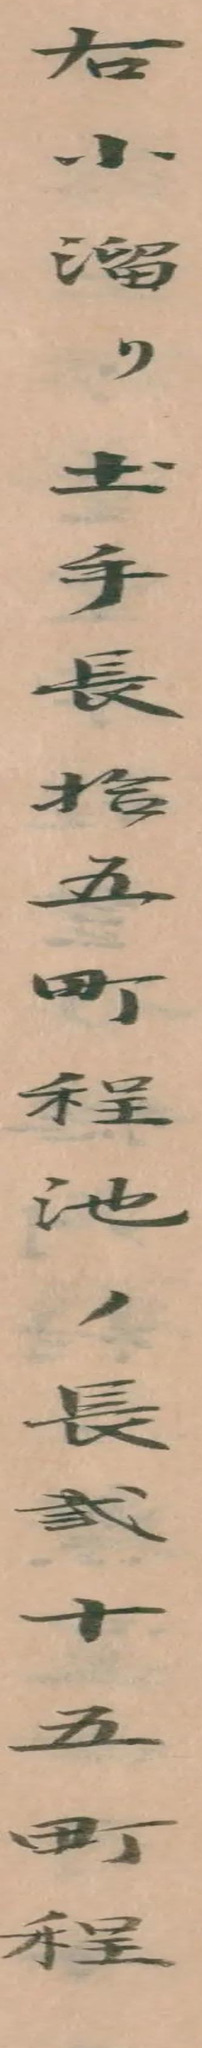右小溜リ土手長拾五町程池ノ長弐十五町程
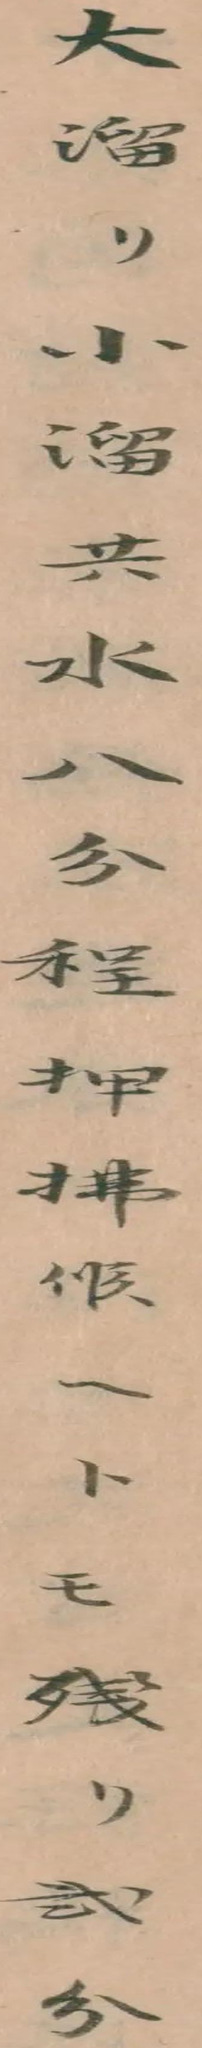大溜リ小溜共水八分程押払候ヘトモ残リ弐分
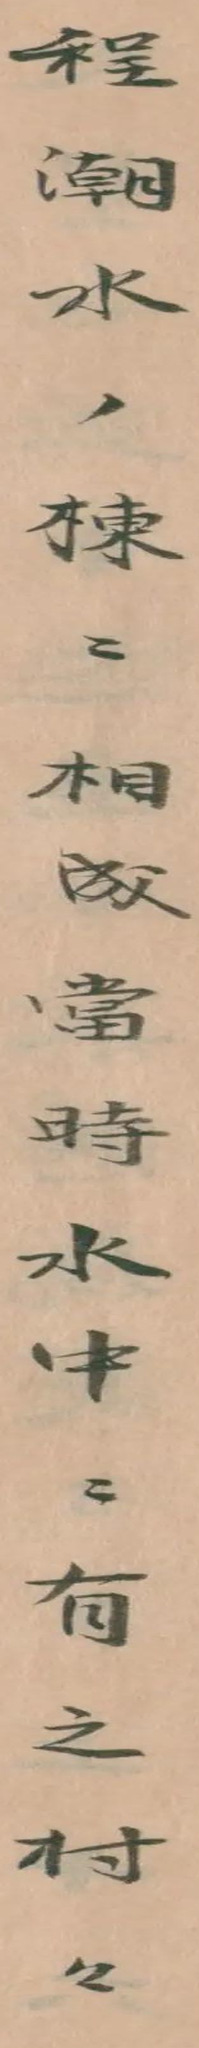程潮水ノ棟ニ相成当時水中ニ有之村々
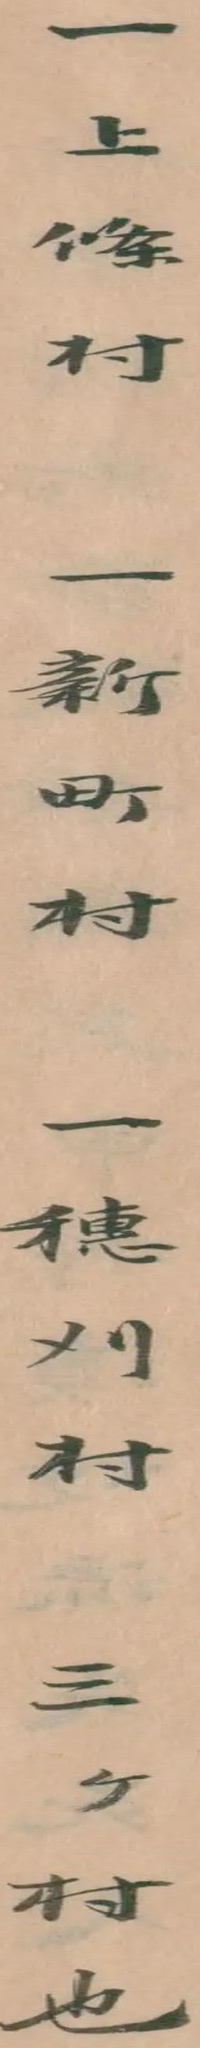一上條村一新町村一穂刈村三ケ村也

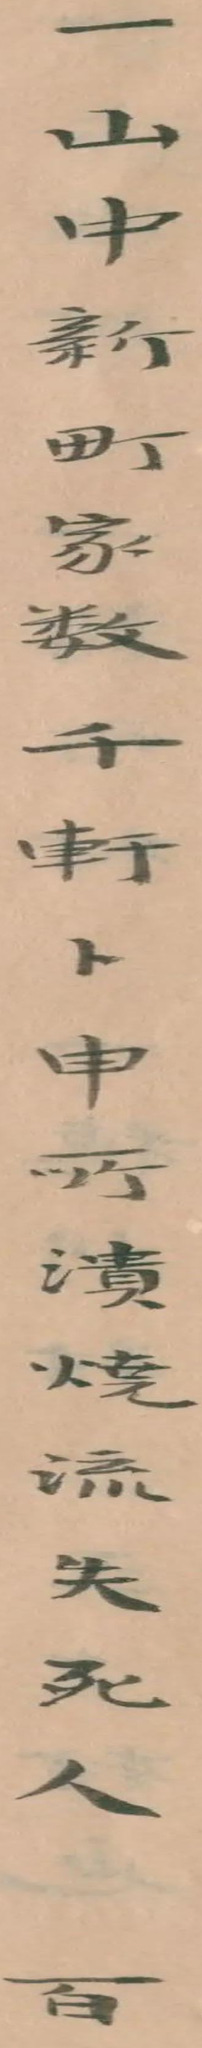一山中新町家数千軒ト申所潰焼流失死人百
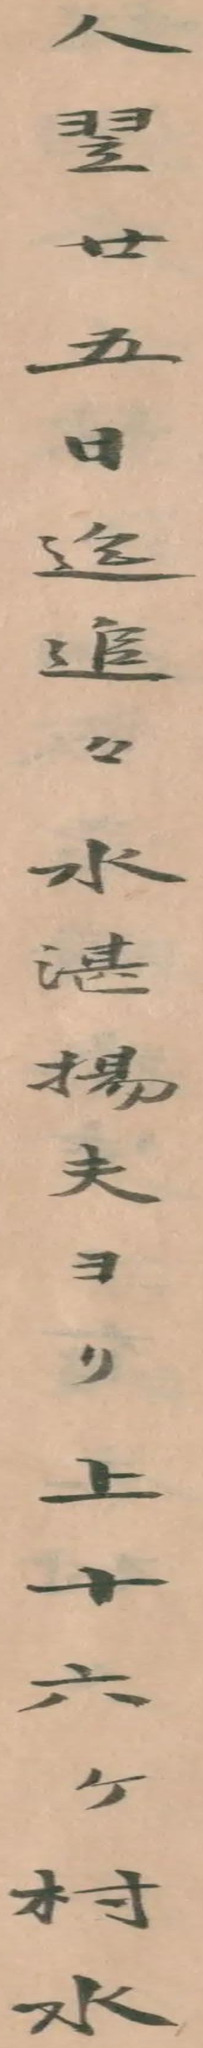人翌廿五日迄追々水湛揚夫ヨリ上十六ケ村水
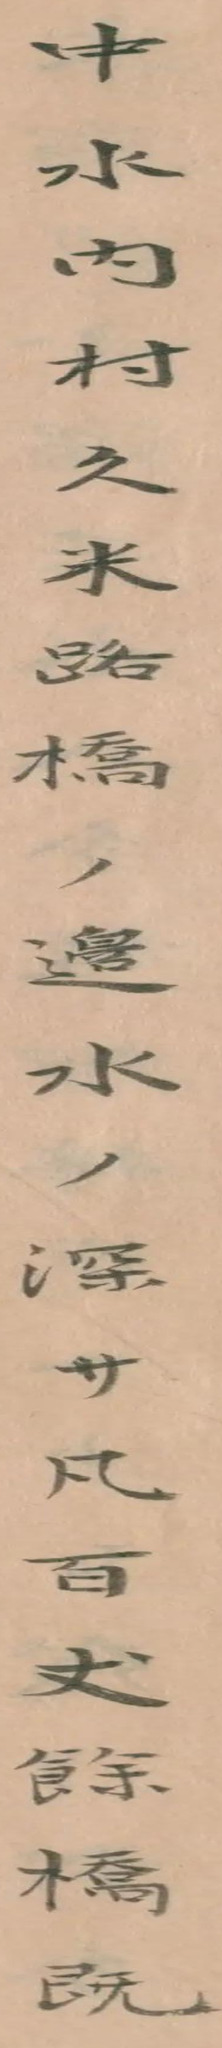中水内村久米路橋ノ辺水ノ深サ凡百丈余橋既
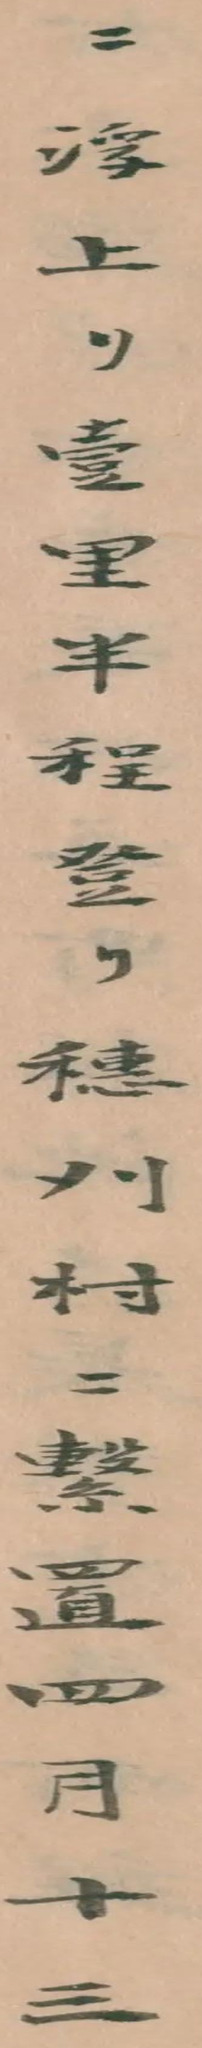ニ浮上リ壹里半程登リ穂刈村ニ繋置四月十三
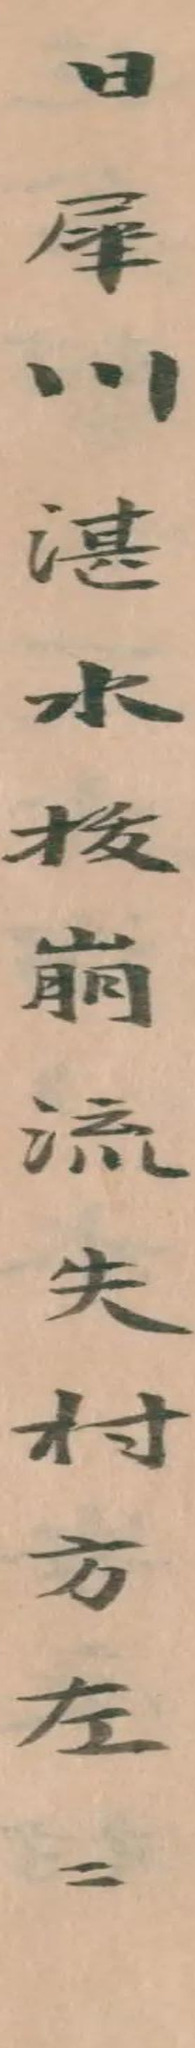日犀川湛水抜崩流失村方左ニ
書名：地災撮要. 巻5-6(地震之部)
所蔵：国立国会図書館 National Diet Library, JAPAN
